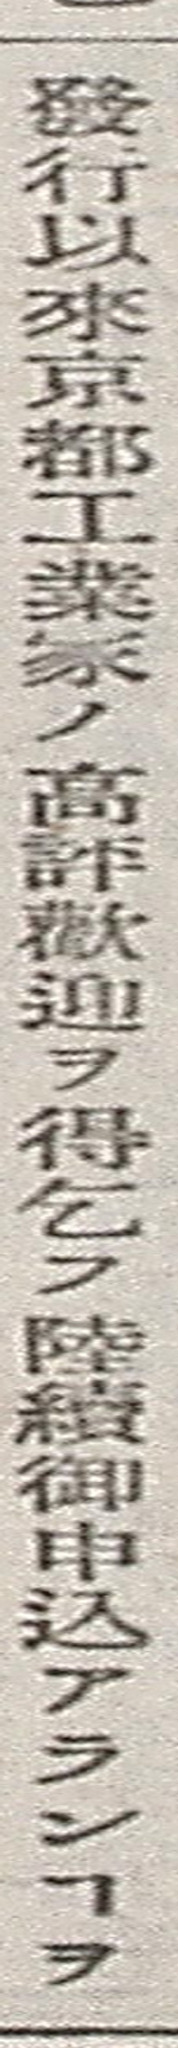発行以来京都工業家ノ高評歓迎ヲ得乞フ陸続御申込アランヿヲ
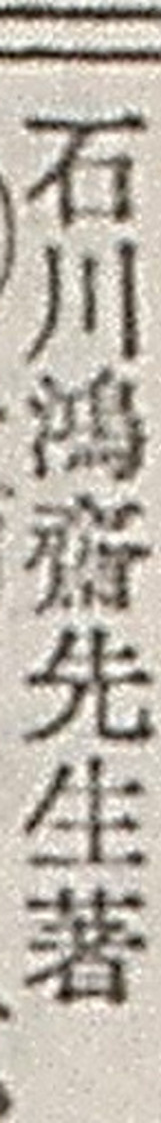石川鴻斎先生著
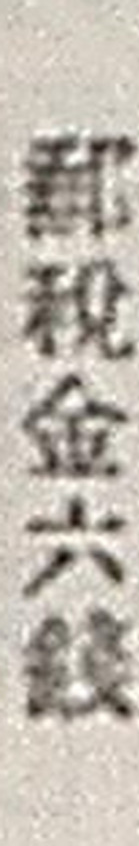郵税金四銭
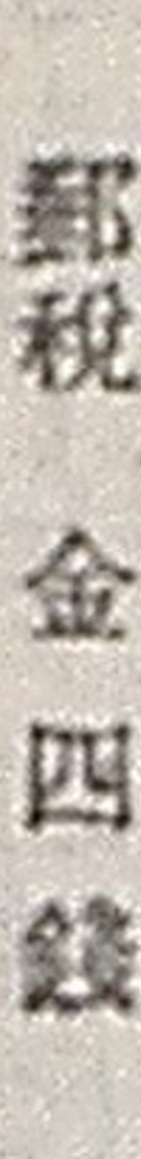郵税金四銭
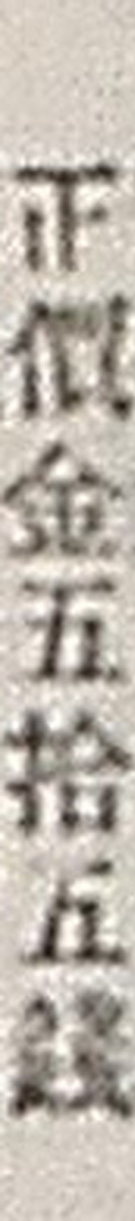正価金五拾五銭
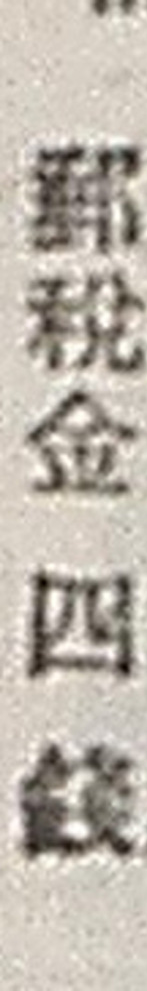郵税金四銭
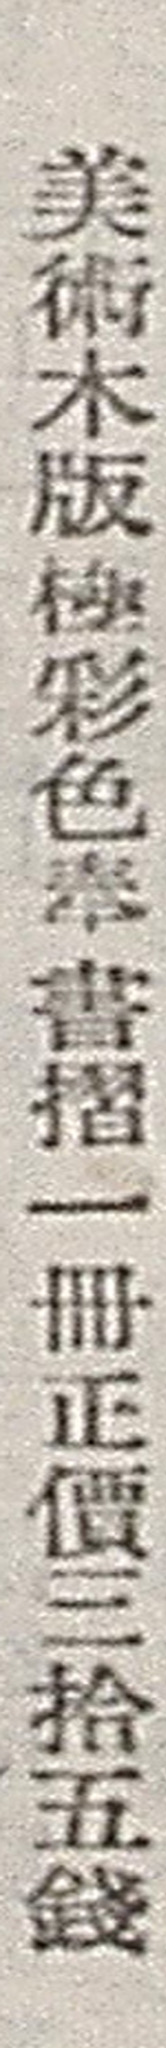美術木版極彩色奉書摺一冊正価三拾五銭
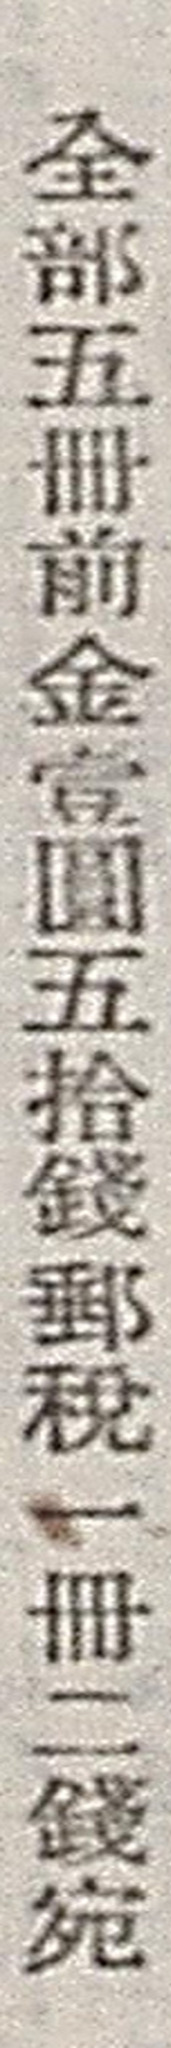全部五冊前金一円五拾銭郵税一冊二銭宛
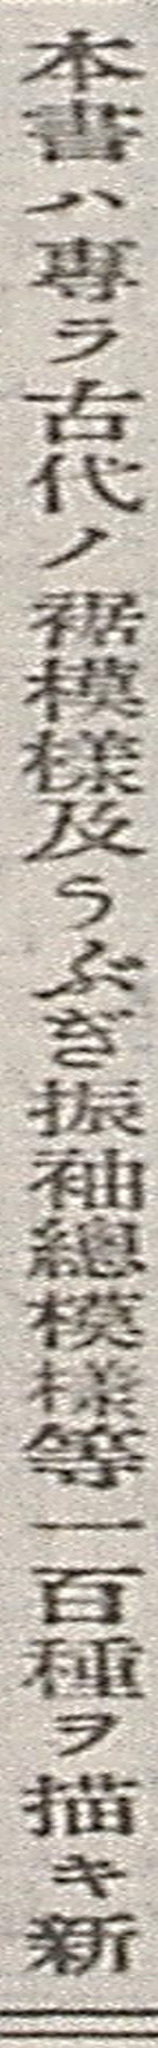本書ハ専ラ古代ノ裾模様及うぶぎ振袖総模様等一百種ヲ描キ新
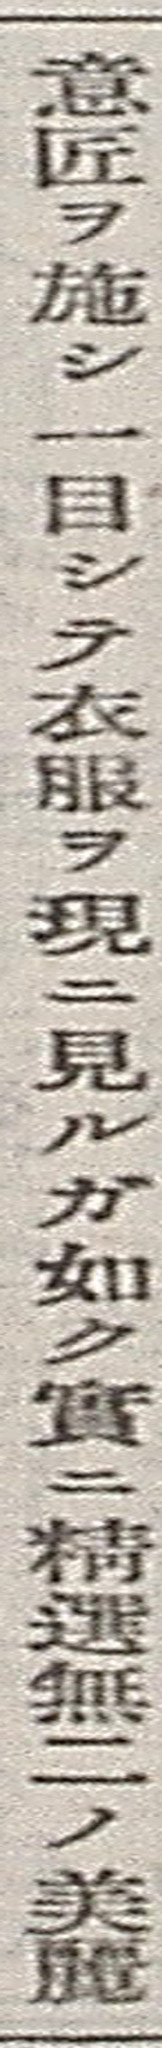意匠ヲ施シ一目シテ衣服ヲ現ニ見ルガ如ク実ニ精選無二ノ美麗
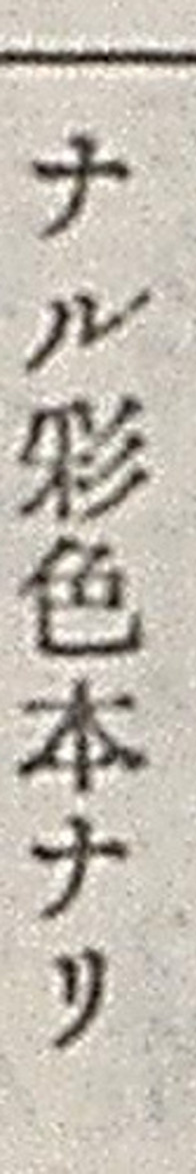ナル彩色本ナリ
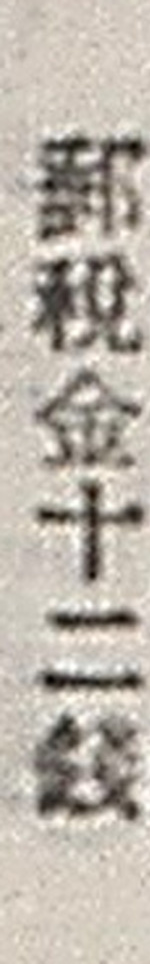郵税金四銭
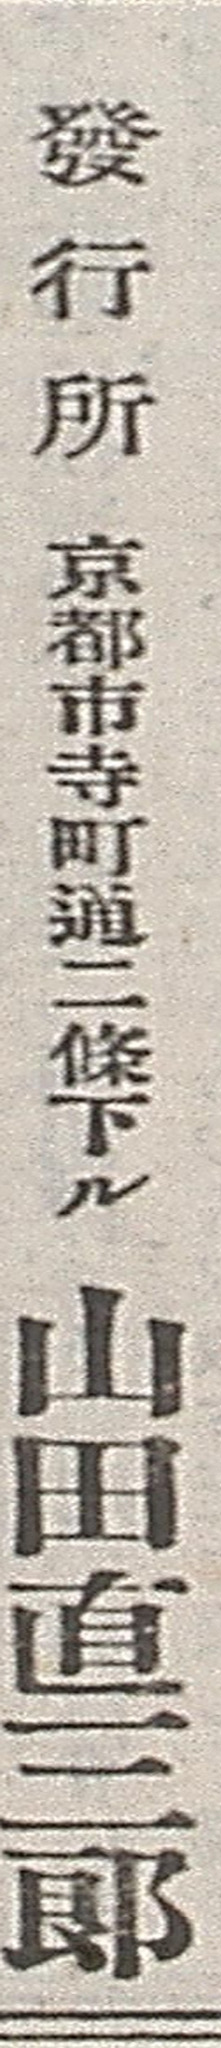発行所京都市寺町通二条下ル山田直三郎
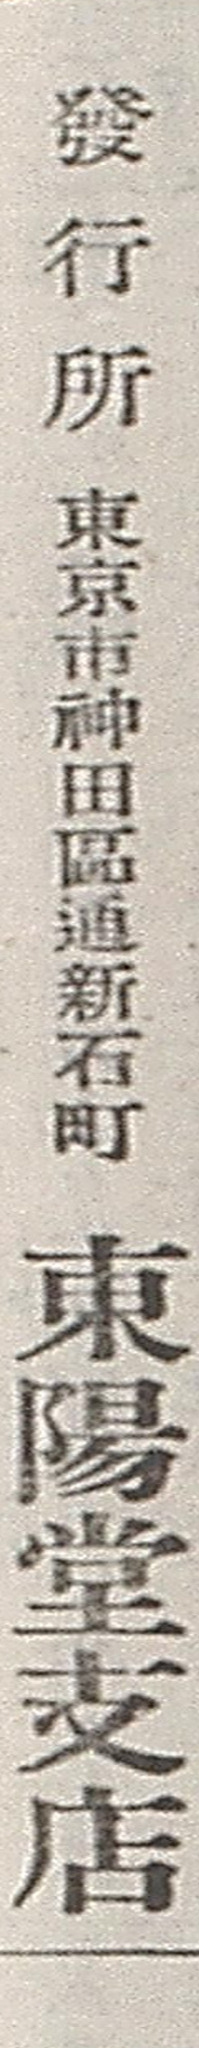売捌所東京市神田通新石町東陽堂支店
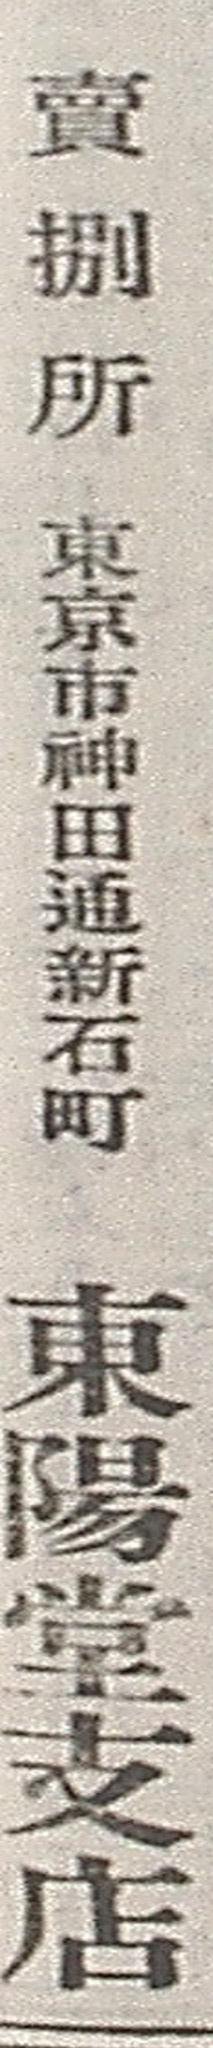売捌所東京市神田通新石町東陽堂支店
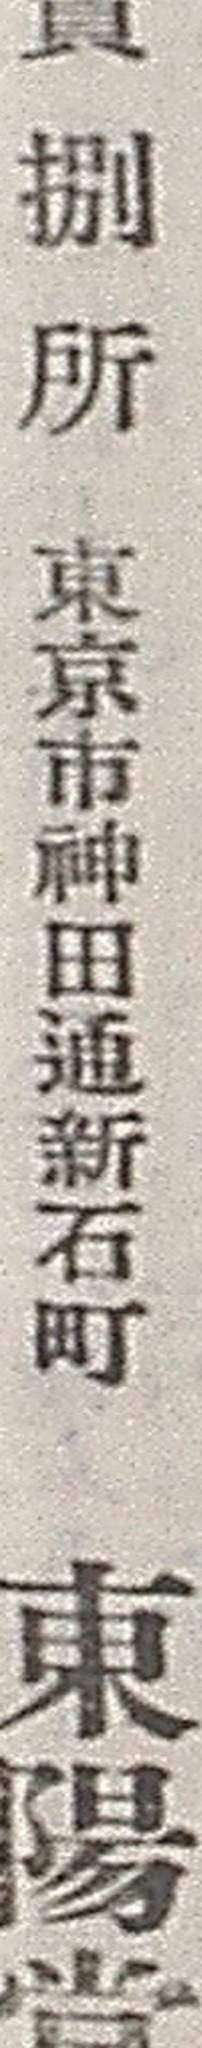売捌所東京市神田通新石町東陽堂支店
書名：風俗畫報臨時増刊第百二十四號　洪水地震被害録（上）
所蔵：東京大学地震研究所図書室 Earthquake Research Institute Library, The University of Tokyo, JAPAN
